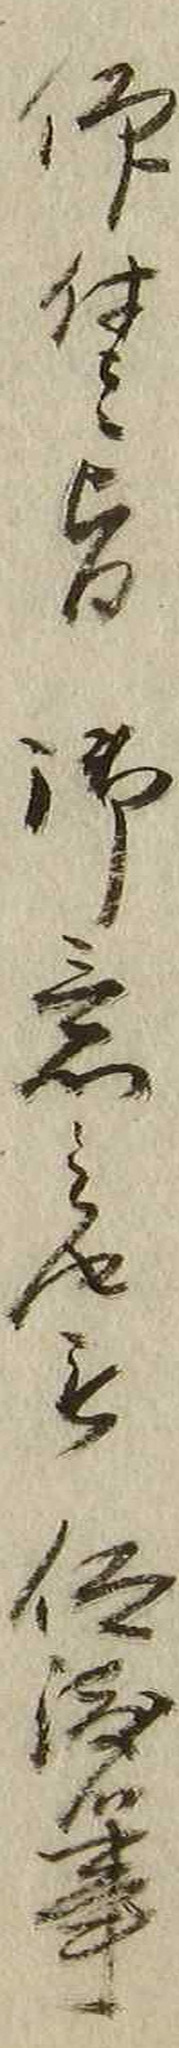仰付之旨御意之由被仰渡候事
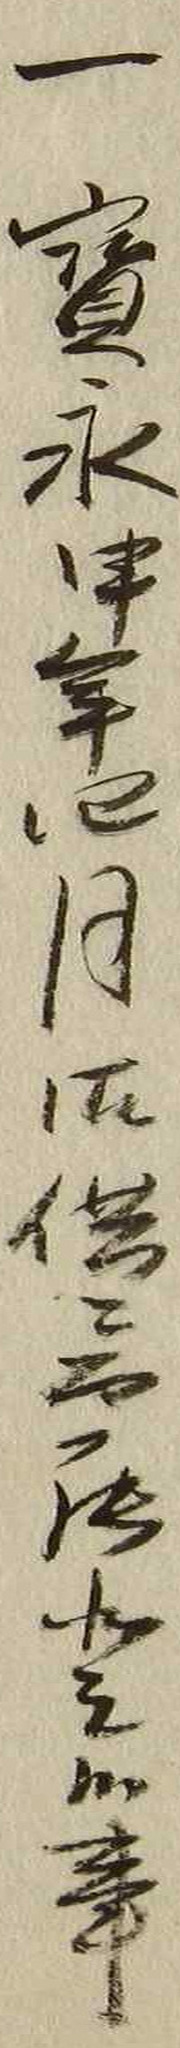一宝永申年四月御供ニ而罷登候事
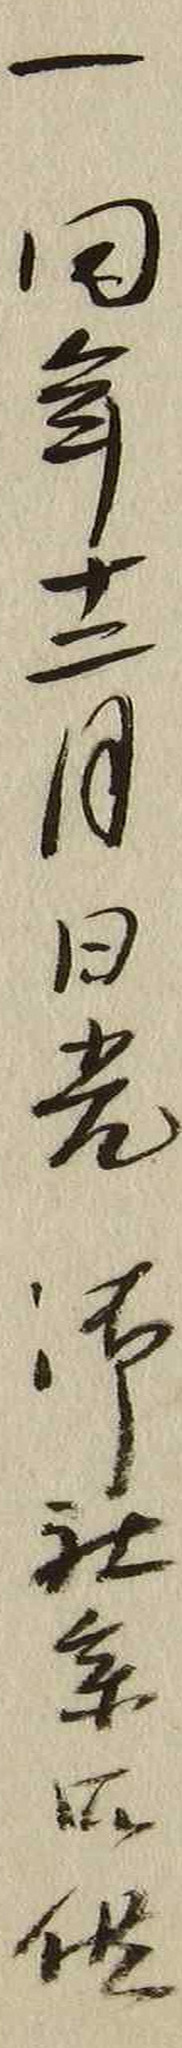一同年十二月日光御社参御供
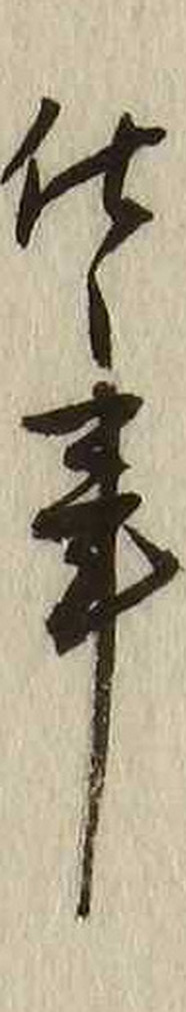仕候事
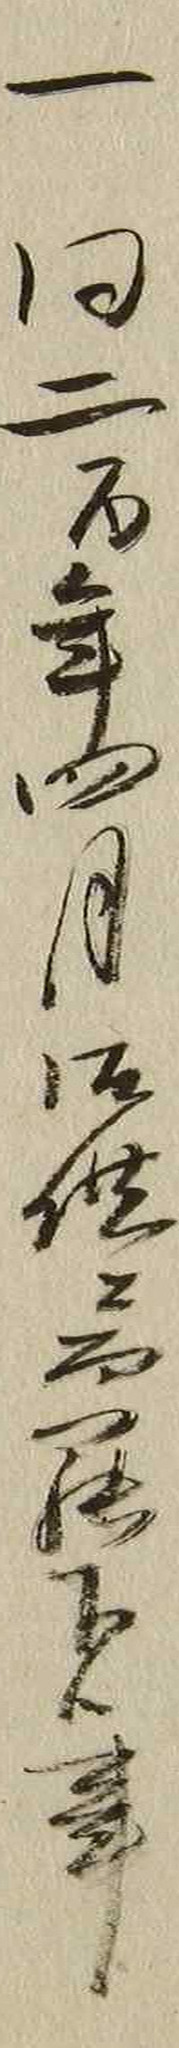一同二酉年四月御供ニ而罷下候事
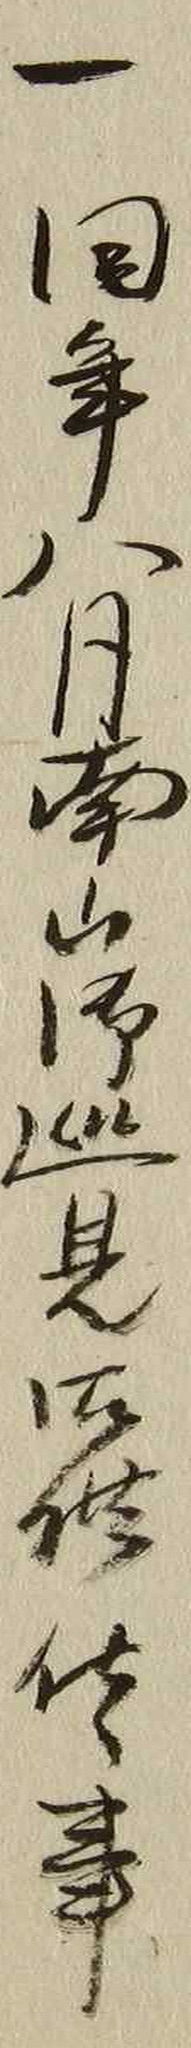一同年八月南山御巡見御供仕候事
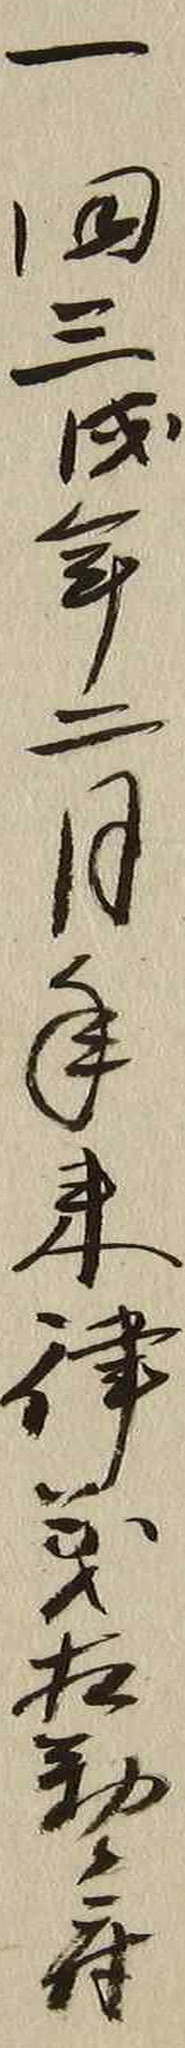一同三戌年二月年来律義相勤候ニ付
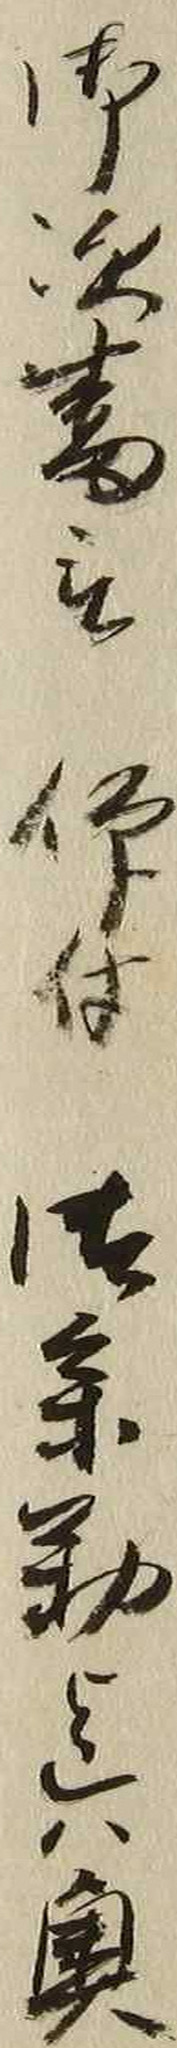御次番被仰付御参勤迄ハ奥
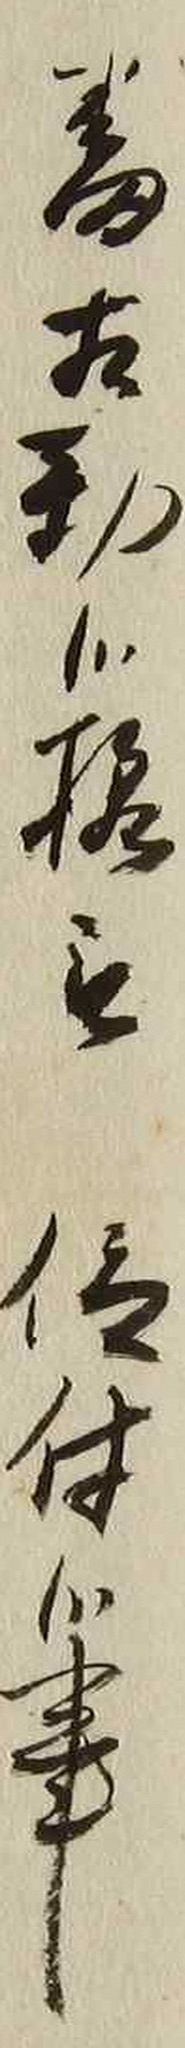番相勤候様被仰付候事
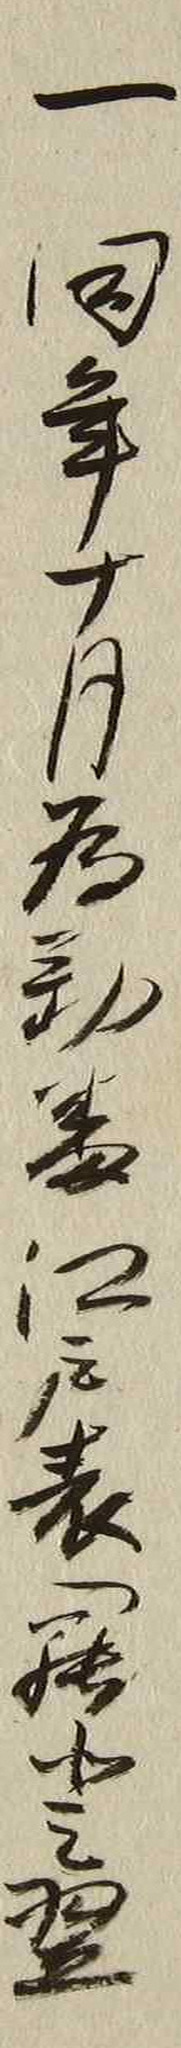一同年十月為勤番江戸表へ罷登翌
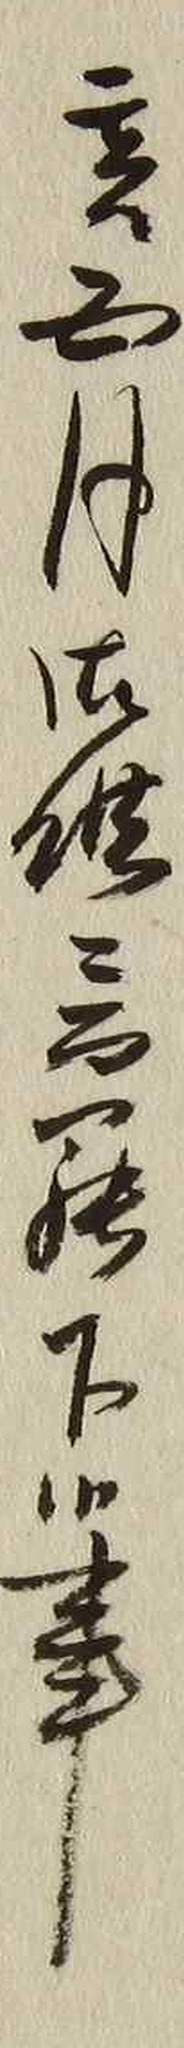亥五月御供ニ而罷下候事
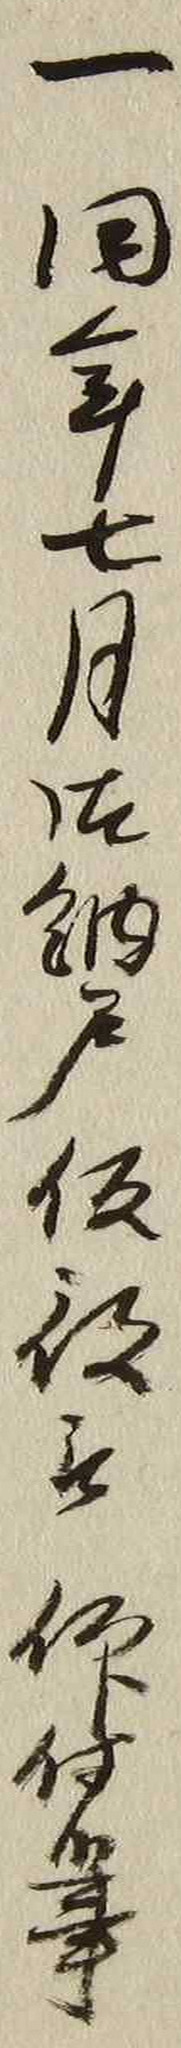一同年七月御納戸仮役被仰付候事
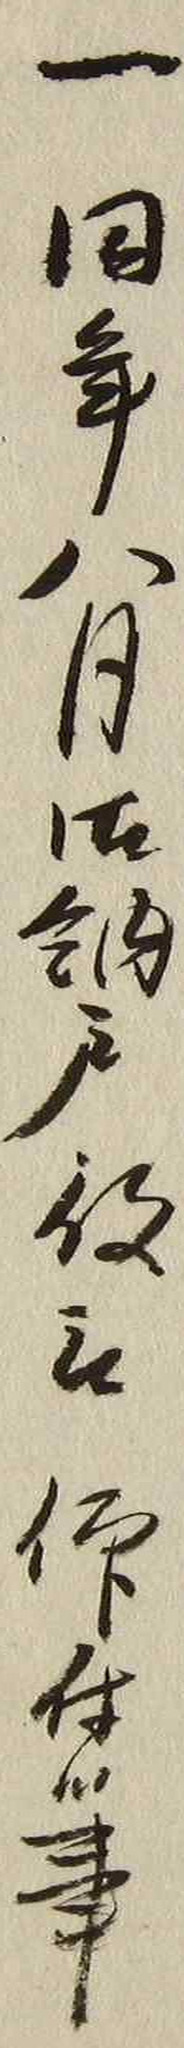一同年八月御納戸役被仰付候事
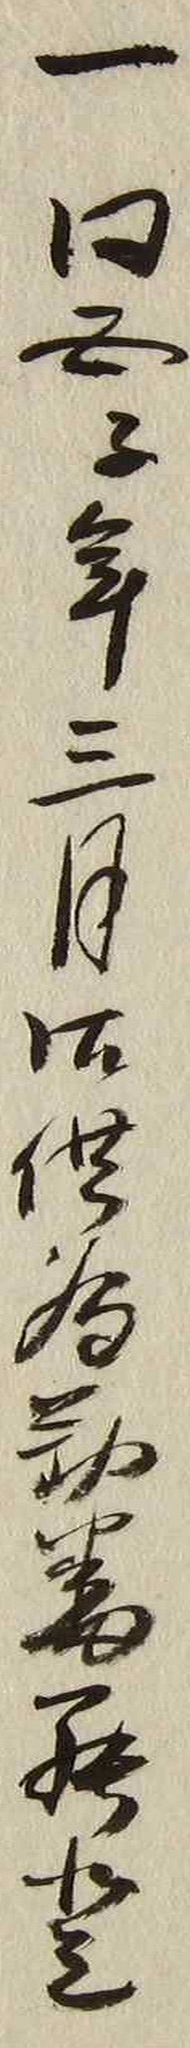一同五子年三月御供為勤番罷登
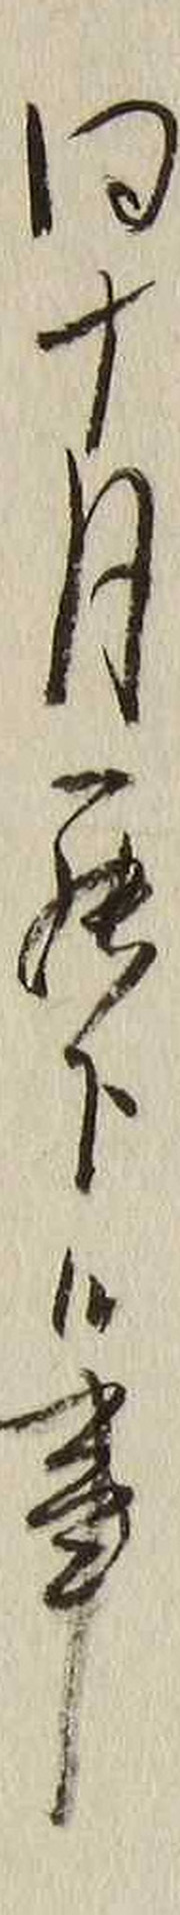同十月罷下候事
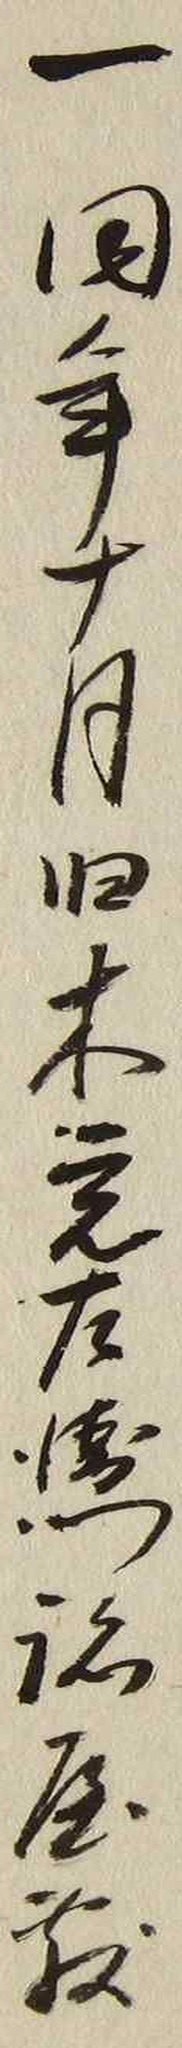一同年十月旧木覚左衛門跡屋敷
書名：諸士系譜　巻之346　も之部2
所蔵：会津若松市立会津図書館
